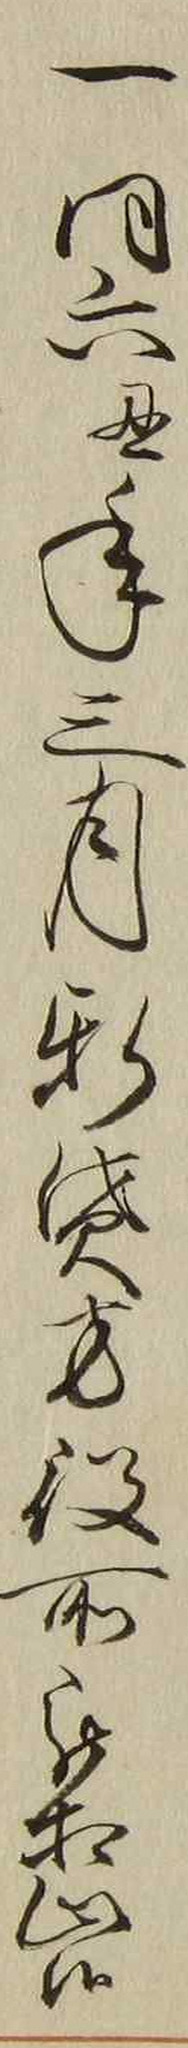一同六丑年三月新貸方役所被相止候
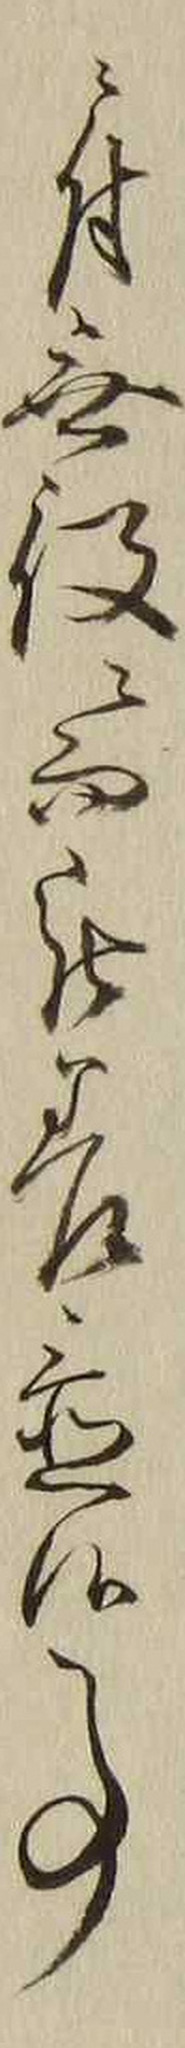ニ付無役ニ而被養置候事
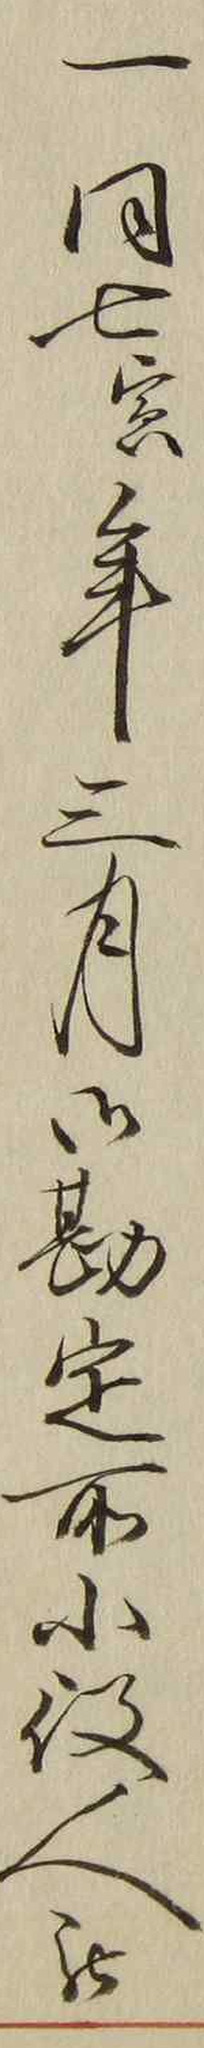一同七寅年三月御勘定所小役人被

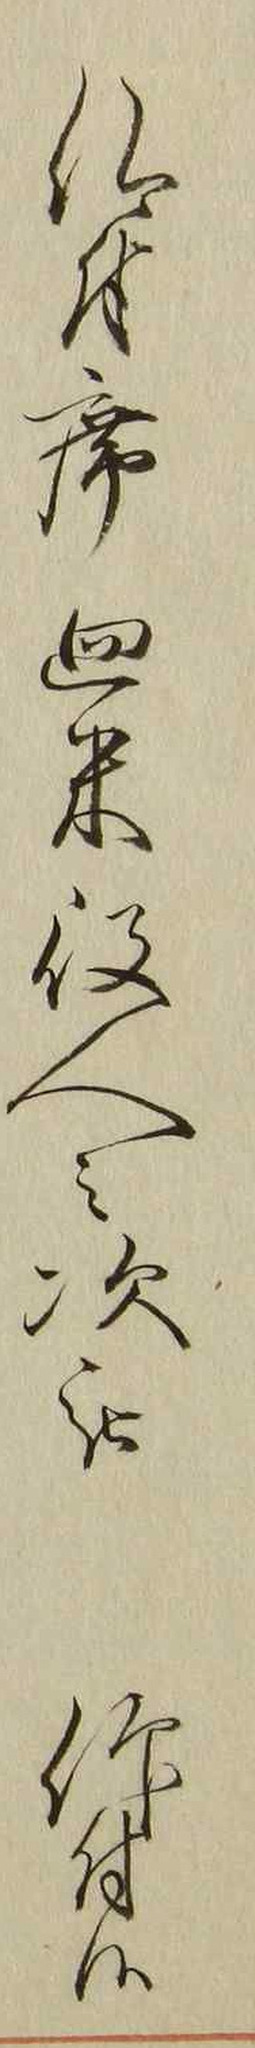仰付席廻米役人之次被仰付候
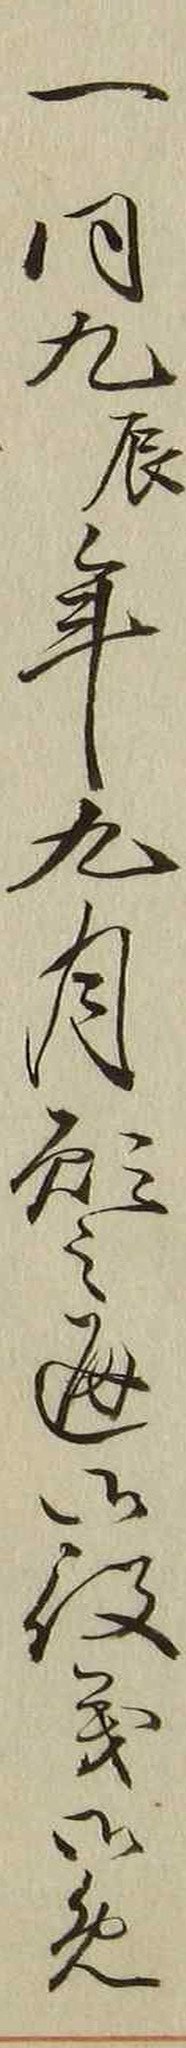一同九辰年九月願之通御役義御免
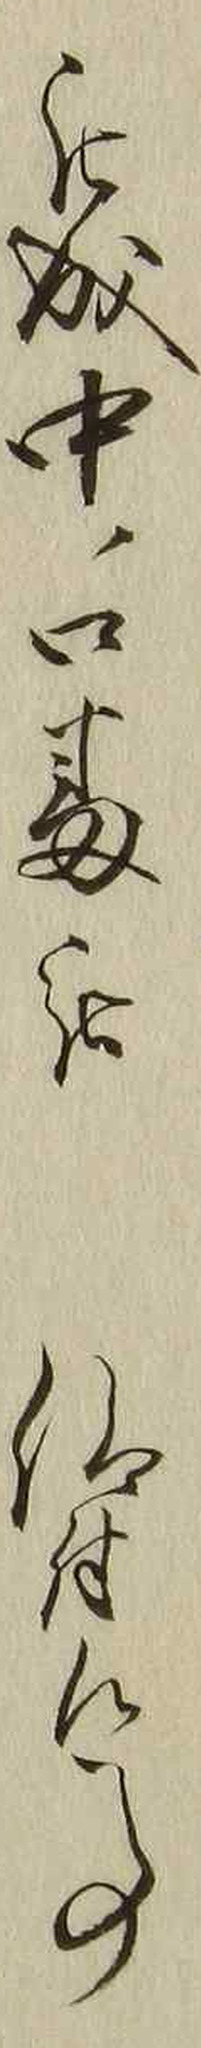被成中ノ口番被仰付候事
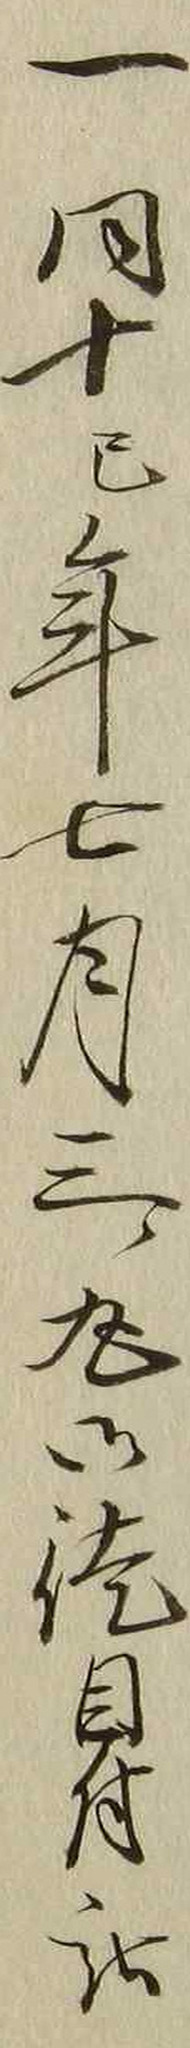一同十巳年七月三ノ丸御徒目付被
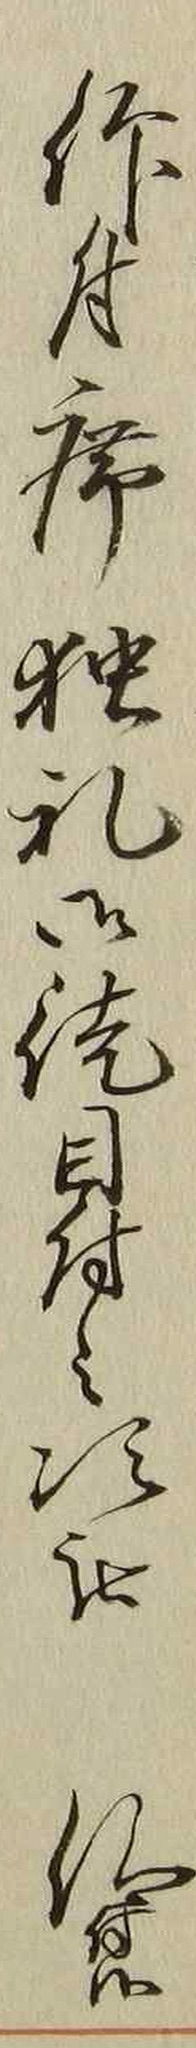仰付席独礼御徒目付之次被仰付候
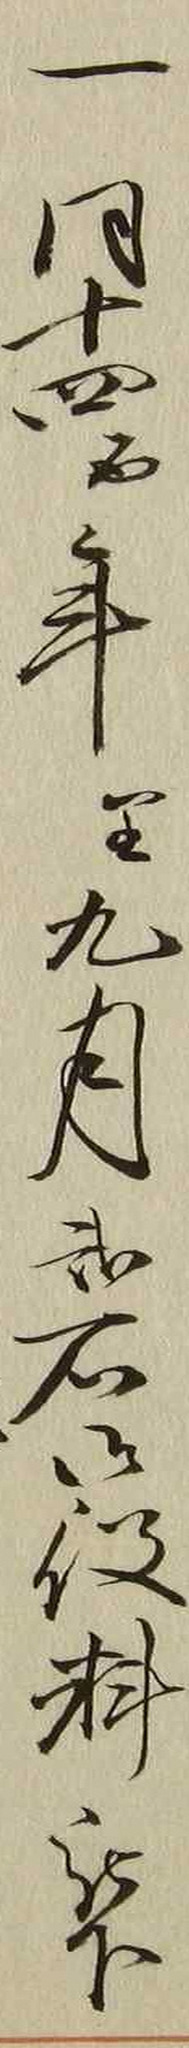一同十四酉年閏九月弐石御役料被下
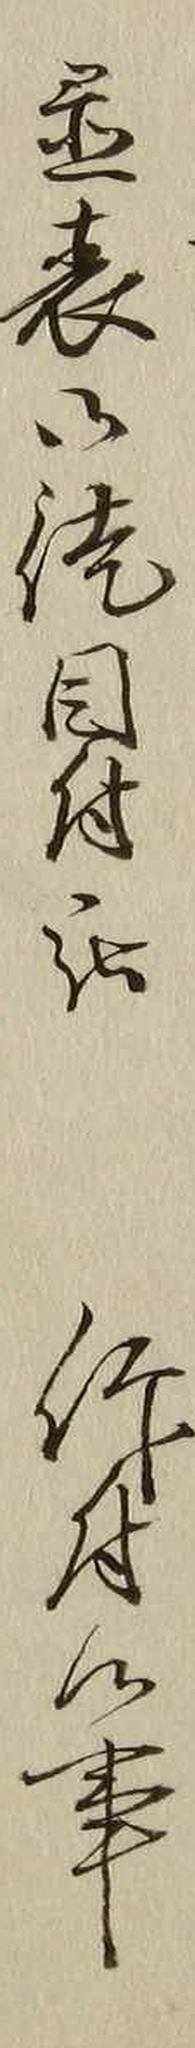置表御徒目付被仰付候事
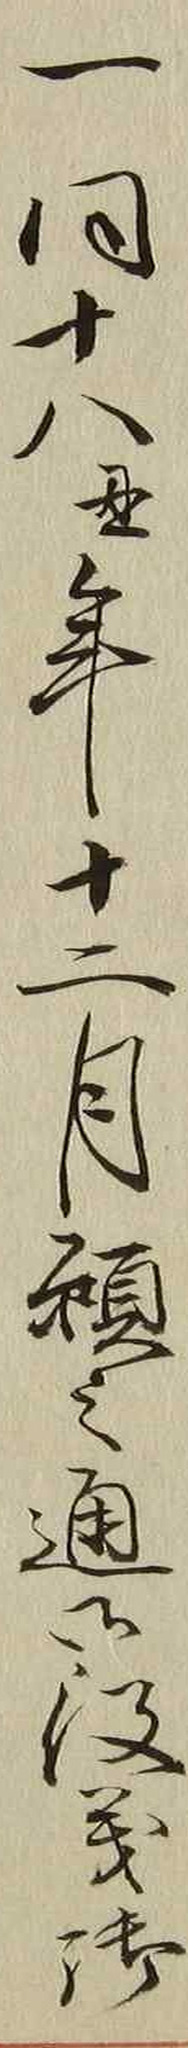一同十八丑年十二月願之通御役義御
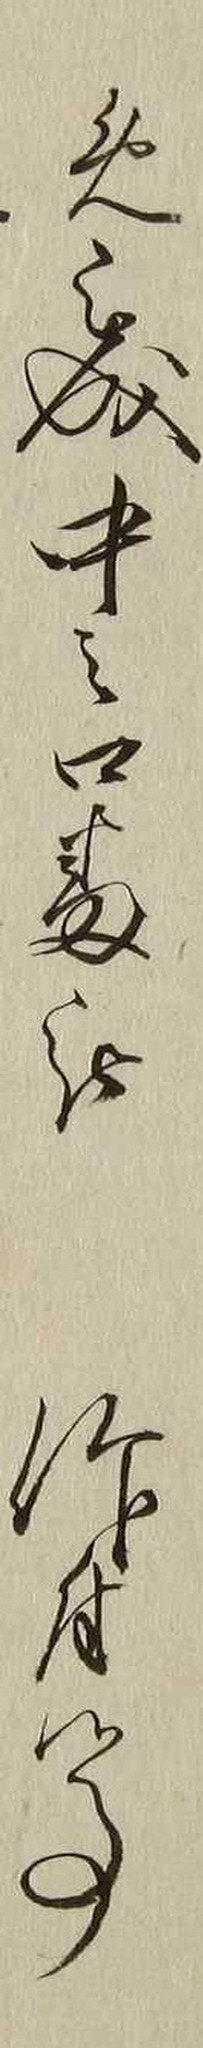免被成中之口番被仰付候事
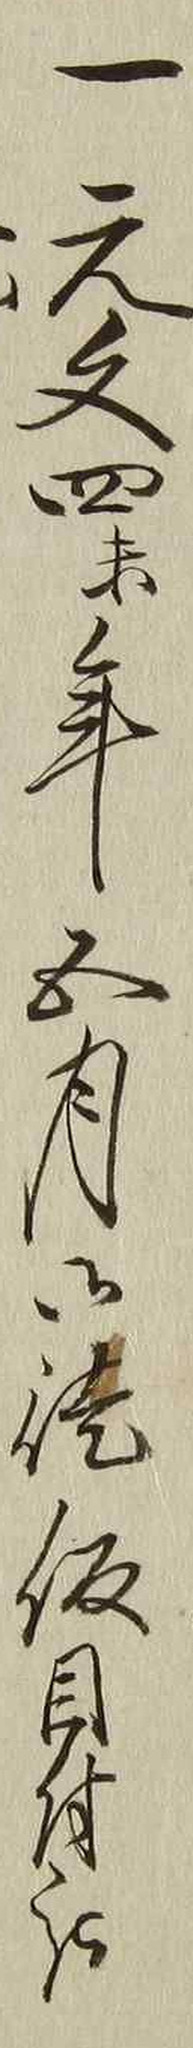一元文四未年五月御徒仮目付被
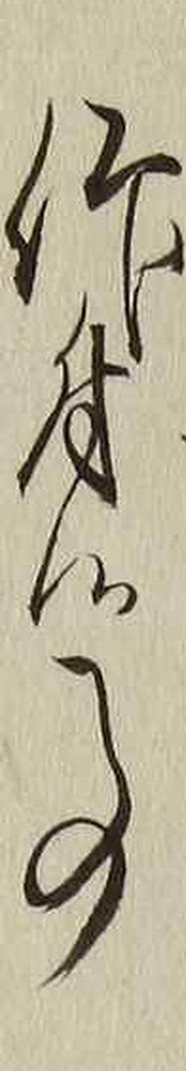仰付候事
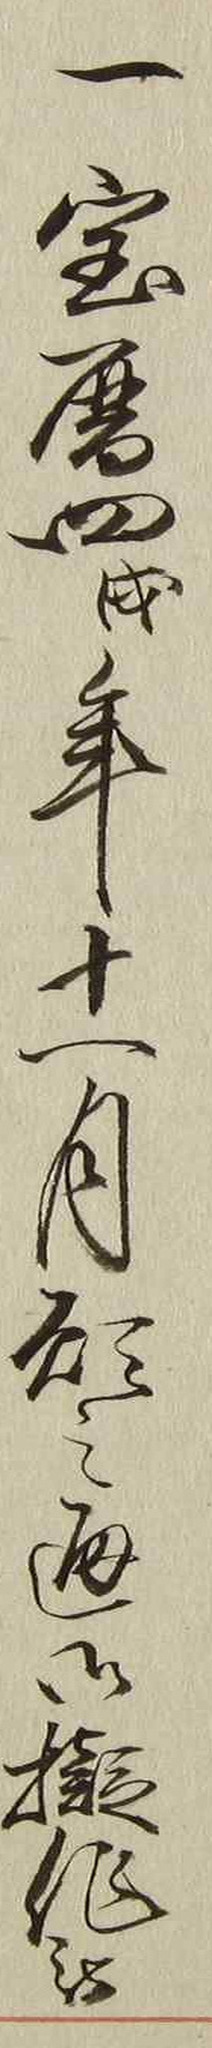一宝暦四戌年十一月願之通御擬作被
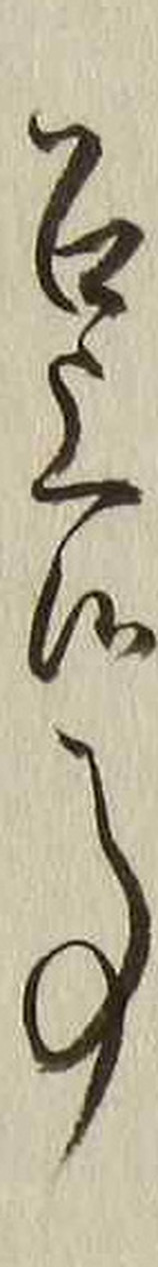召上候事
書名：諸士系譜　巻之57　ほ之部4
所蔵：会津若松市立会津図書館
